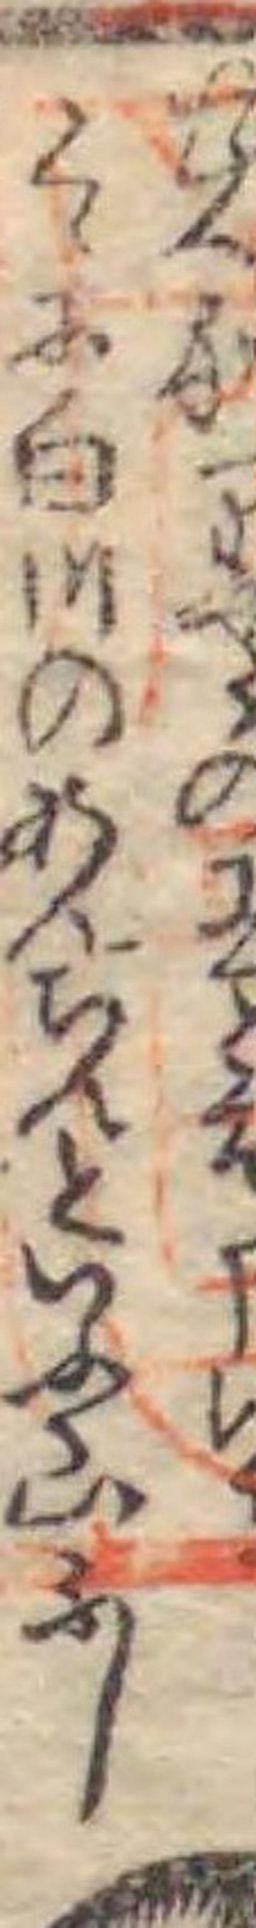こゝに白川のあんちんといふ山ふし
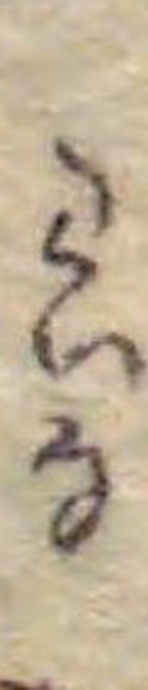わいな
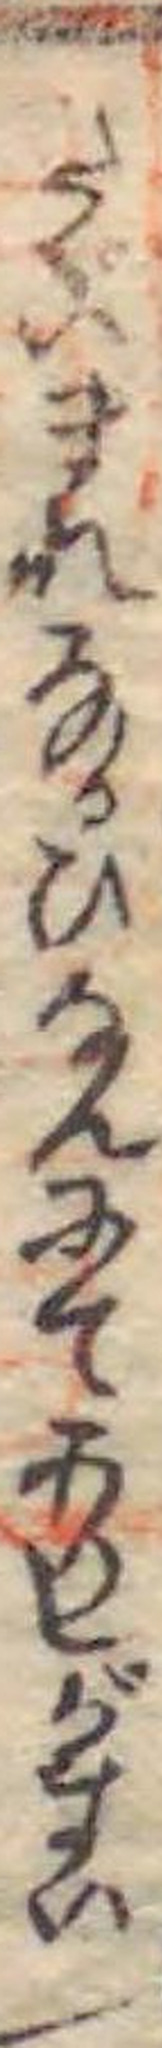たゞいまれなるひなんにてありしがまい
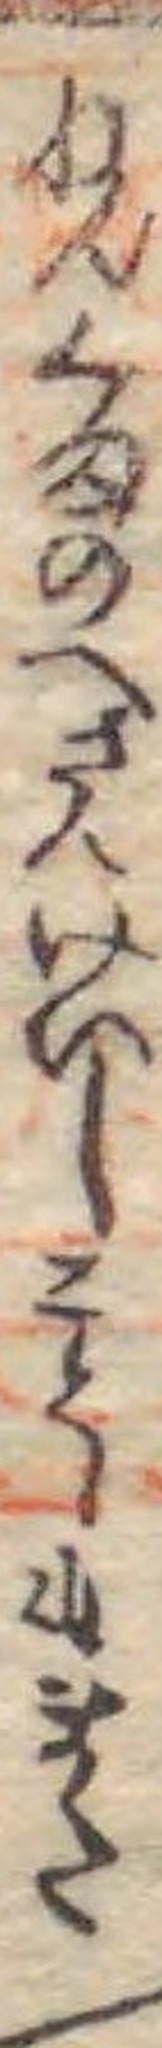ねんくまのへさんけいしことしもまた
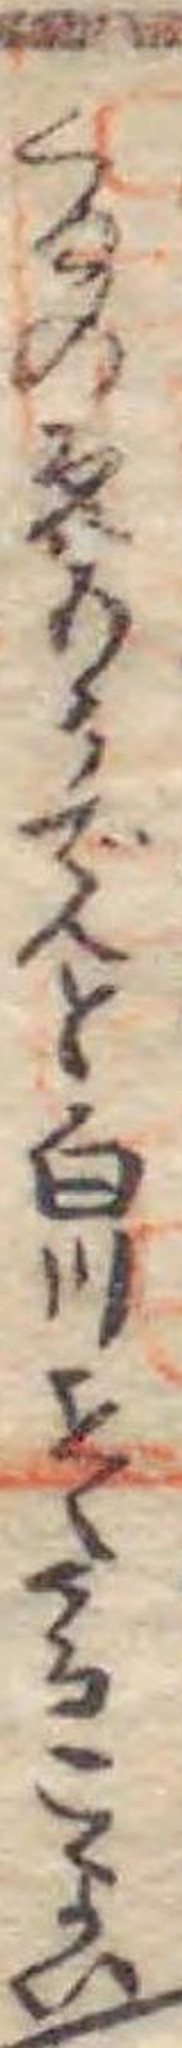くまのゑもうでんと白川をくたるこよい
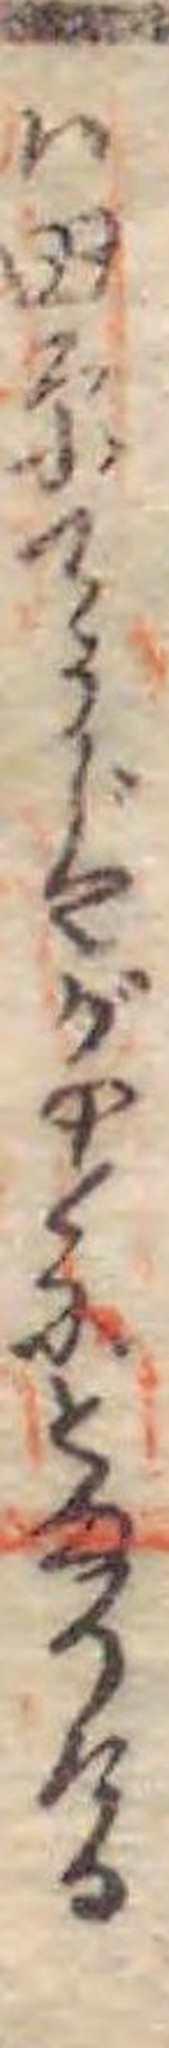は田原てうじやがやとにとまりける
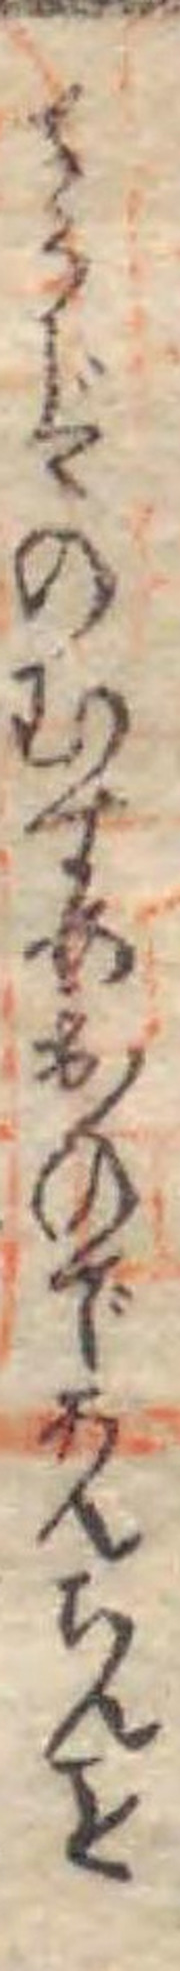てうじはのむすめおひであんちんを
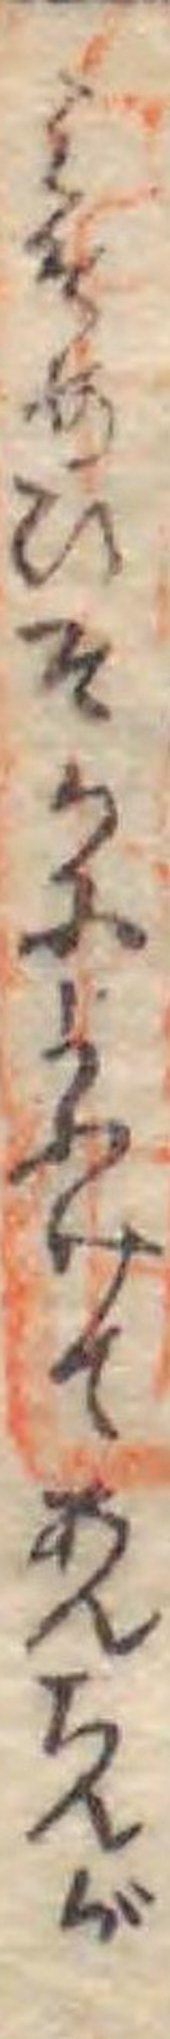みそめひそかによふけてあんちんが
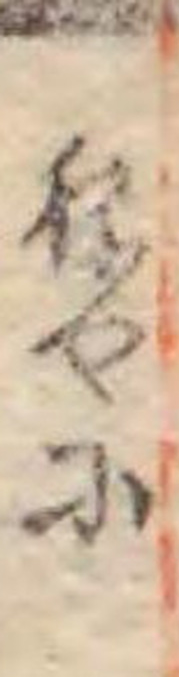ねやに
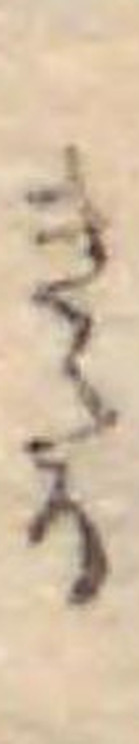きたり
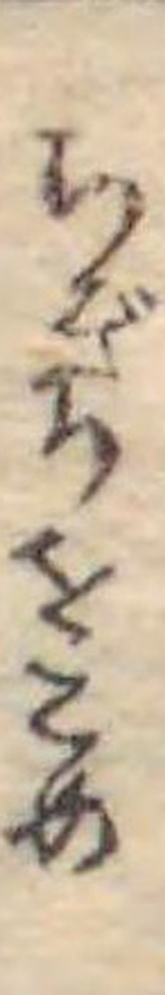ちぎりをこめ
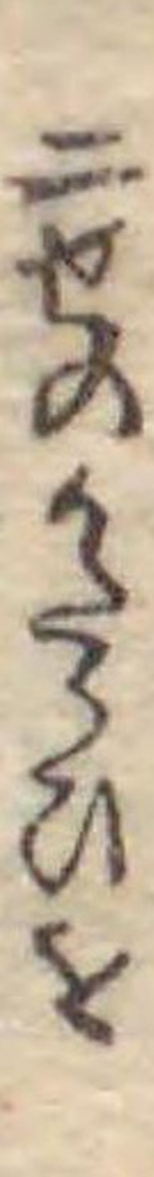二せのかたらひを
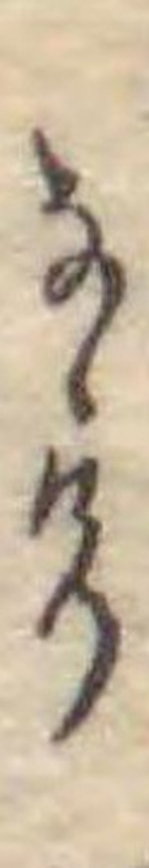なしけり

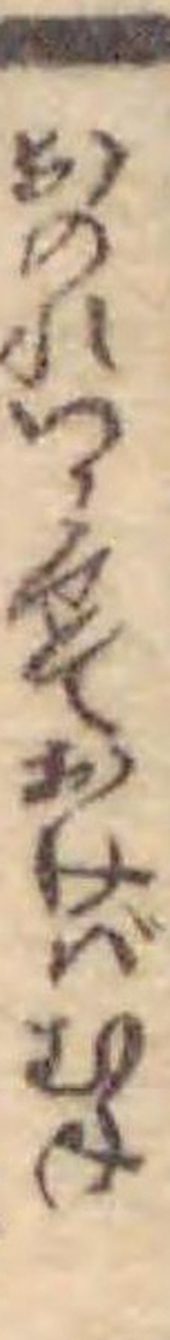おのれいわせておけばむね
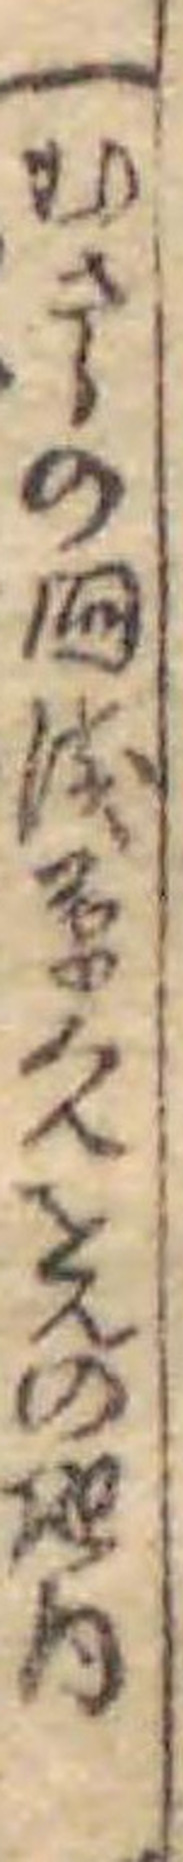むさしの国浅草かんをんの地内
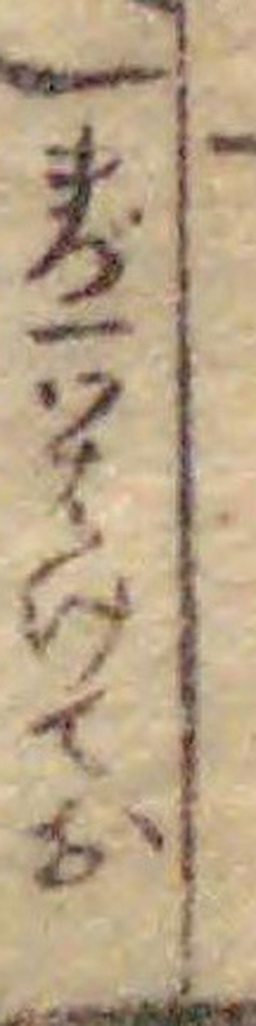まづ一つはけてお
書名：鐘入七人化粧 : 3巻
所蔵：国立国会図書館 National Diet Library, JAPAN
